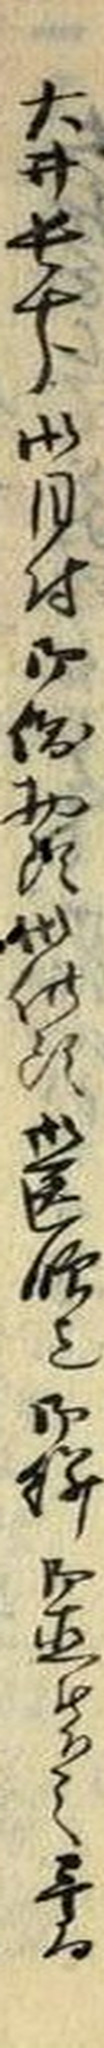大井長十郎御目付御側物頭御供頭御医師迄御餅御直被下之畢而
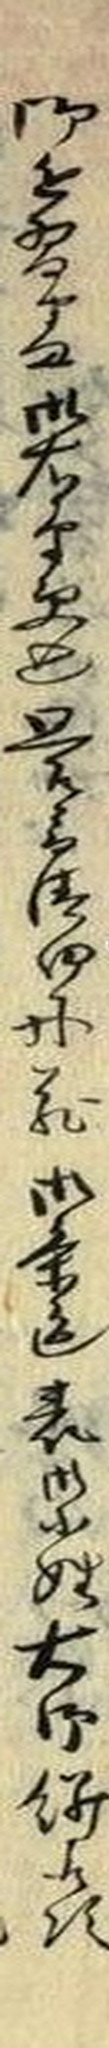御近習番御右筆受込思召ニ而清田丹蔵御茶道表御小姓右御餅取次
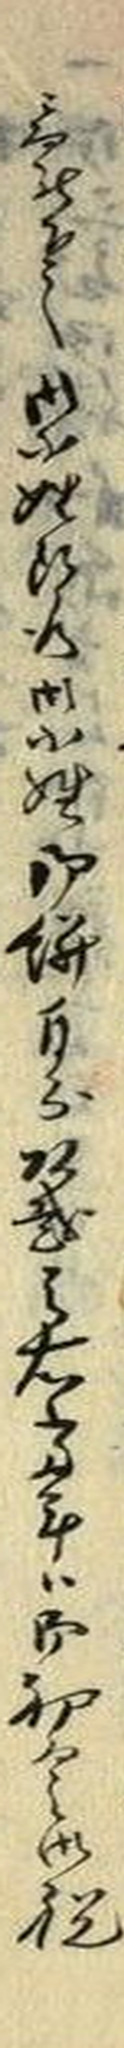ニ而被下之御小姓頭取御小姓御餅自分頂戴之右当年ハ御初而之御祝
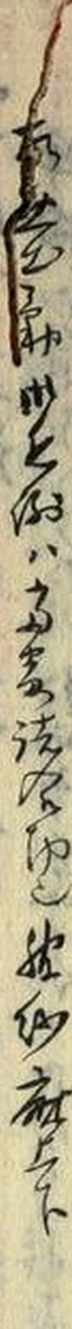故惣出勤御近例ハ当番詰合切也服紗麻上下
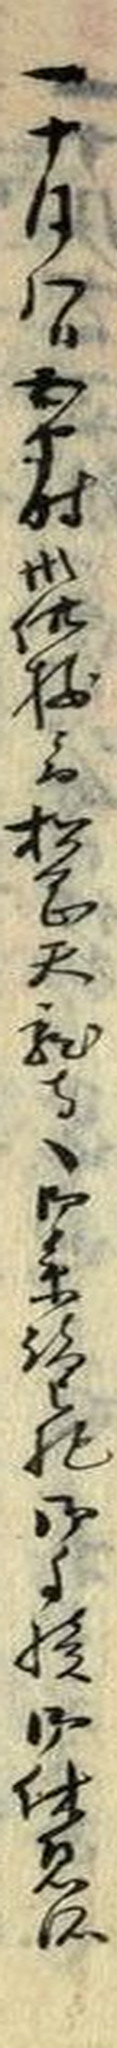一十月八日五半時御供揃ニ而松岡天龍寺へ御参詣被遊御手続御休息所
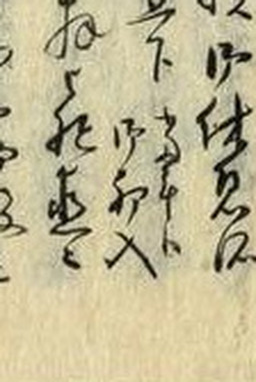御初入
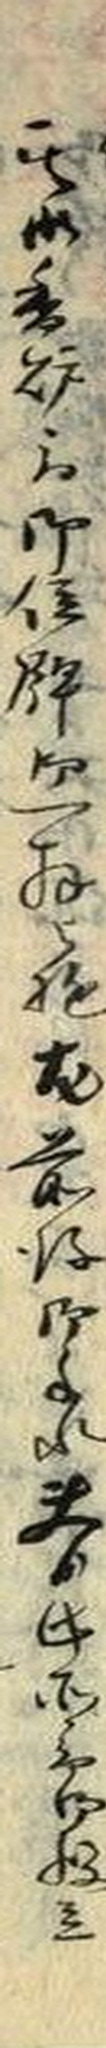其御香炉ニ而御位牌御一拝被遊尤前後御手水夫ゟ此所ニ而御股立
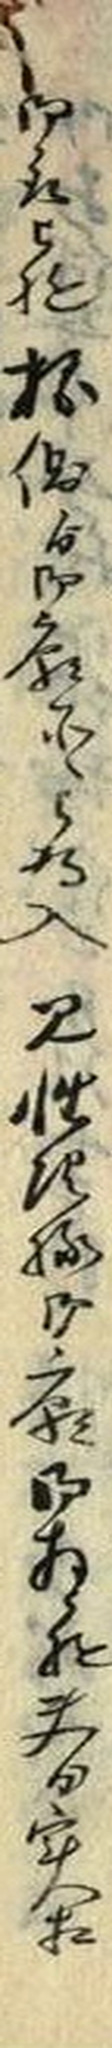御取被遊縁側ゟ御廟所へ被為入見性院様御廟御拝被遊夫ゟ実相
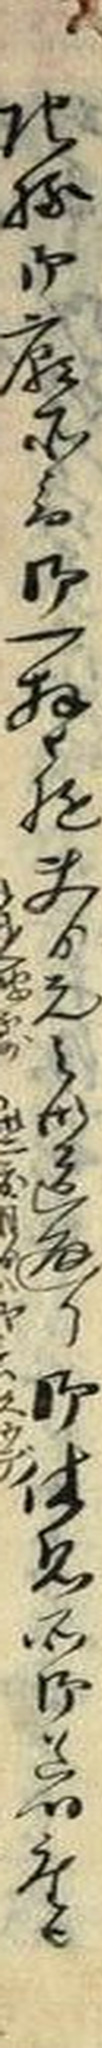院様御廟所ニ而御一拝被遊夫ゟ元之御道通り御休息所御着座被
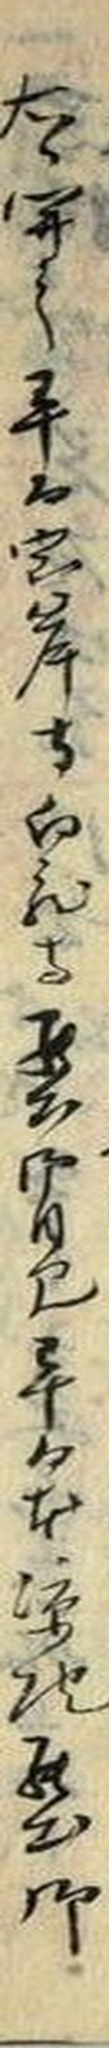右へ開之畢而宝岸寺白龍寺罷出御目見畢而本涼院罷出御
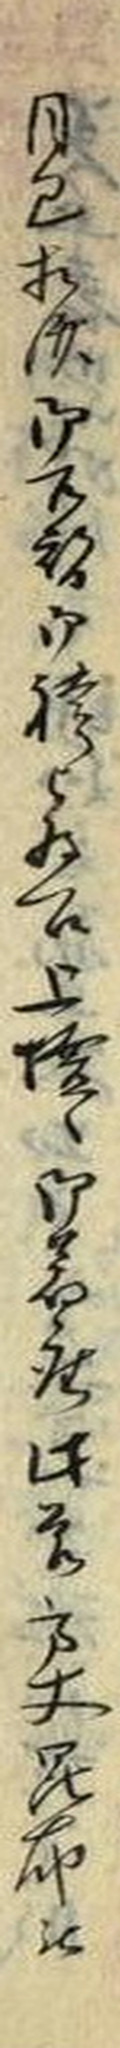目見相済御召替御袴被為召上壇へ御着座此節方丈昆布被

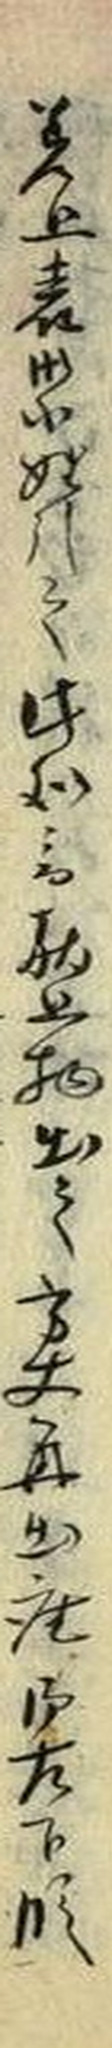差上表御小姓引之此処ニ而献上物出之方丈再出座御左下段
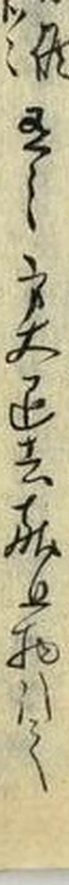品々有之方丈退去献上物引之
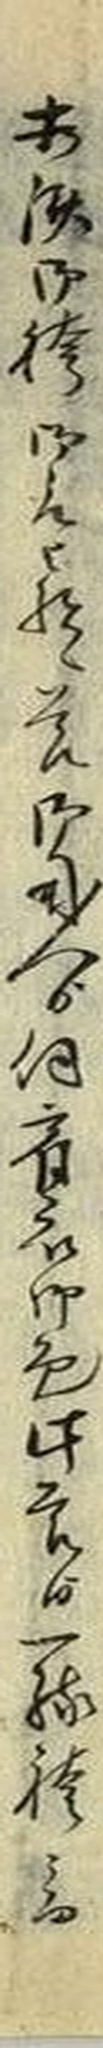相済御袴御取被遊候節御用人ゟ伺肩衣御免此節ゟ一統袴ニ而
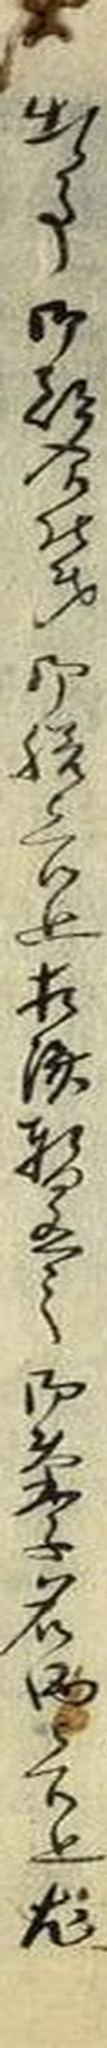出候事御都合次第御膳被召上相済暫有之御菓子名酒被召上尤
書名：少傅日録抄（斉承付側向頭取日記、在国）
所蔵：福井県文書館 Fukui Prefectural Archives
